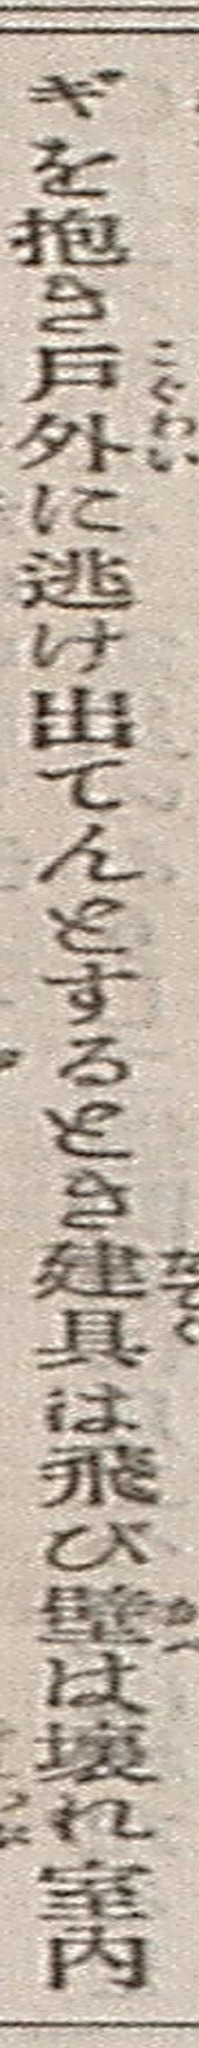ギを抱き戸外に逃け出てんとするとき建具は飛び壁は壊れ室内
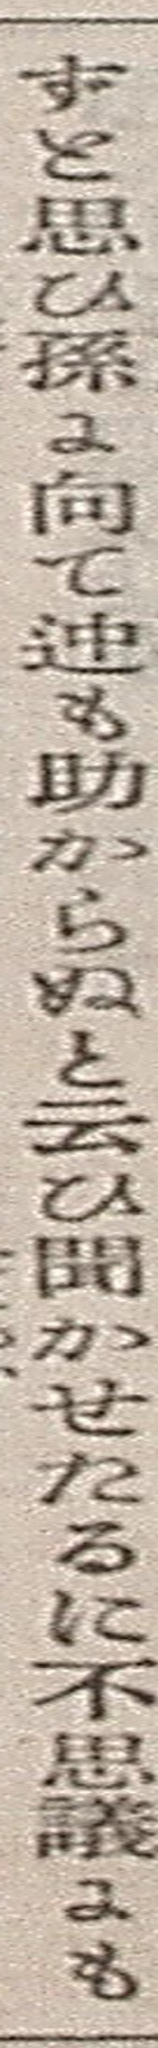ずと思ひ孫に向て迚も助からぬと云ひ聞かせたるに不思議にも
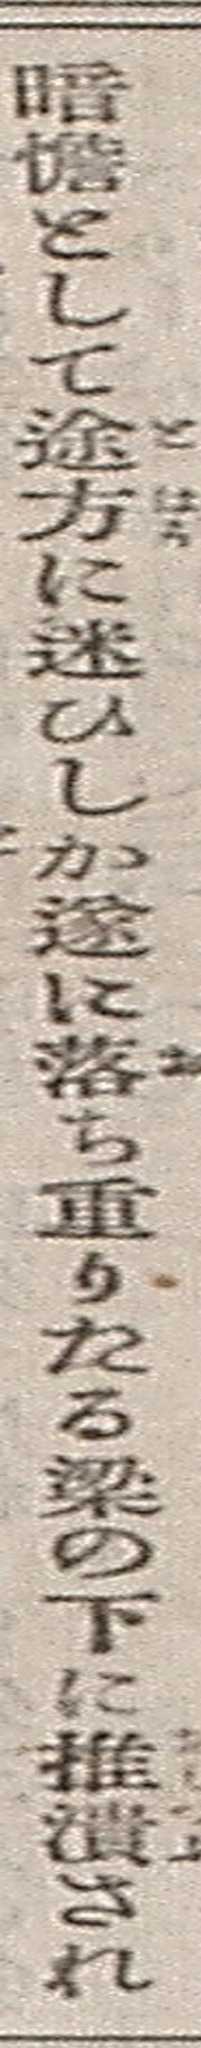暗憺として途方に迷ひしか遂に落ち重りたる梁の下に推潰され
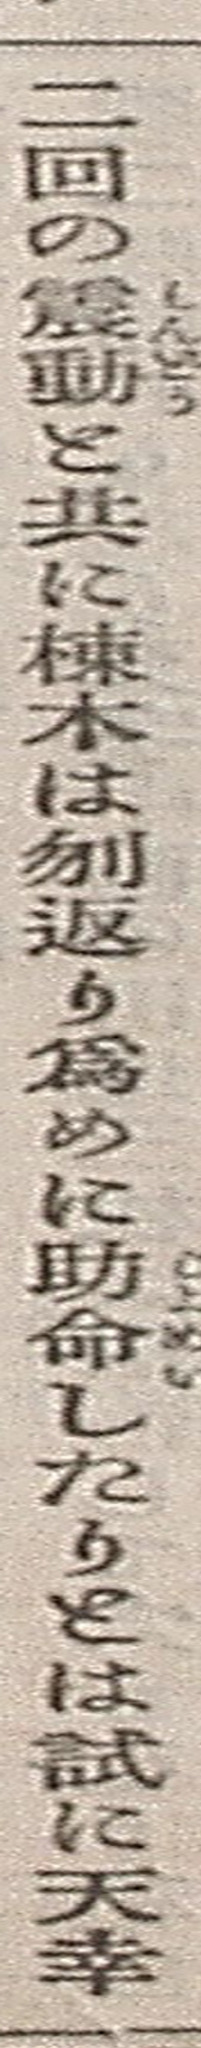二回の震動と共に棟木は刎返り為めに助命したりとは試に天幸
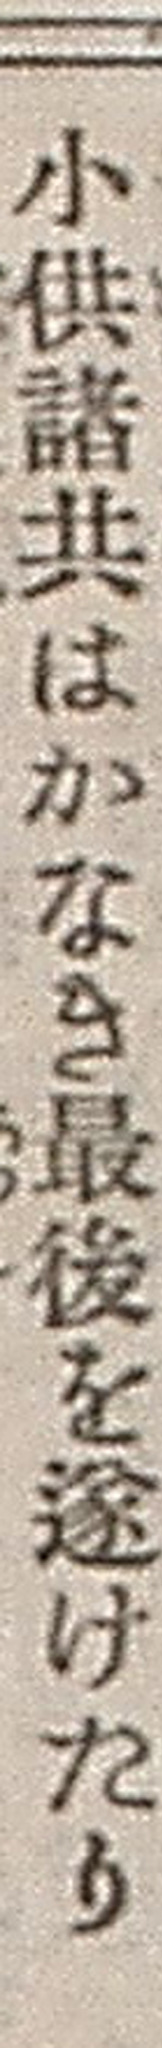小供諸共はかなき最後を遂けたり
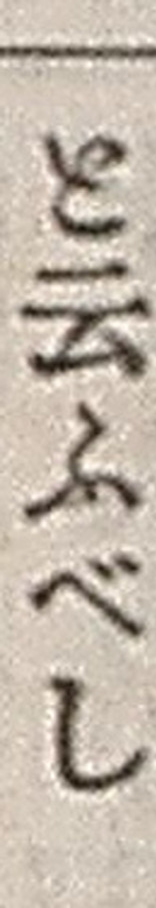と云ふべし
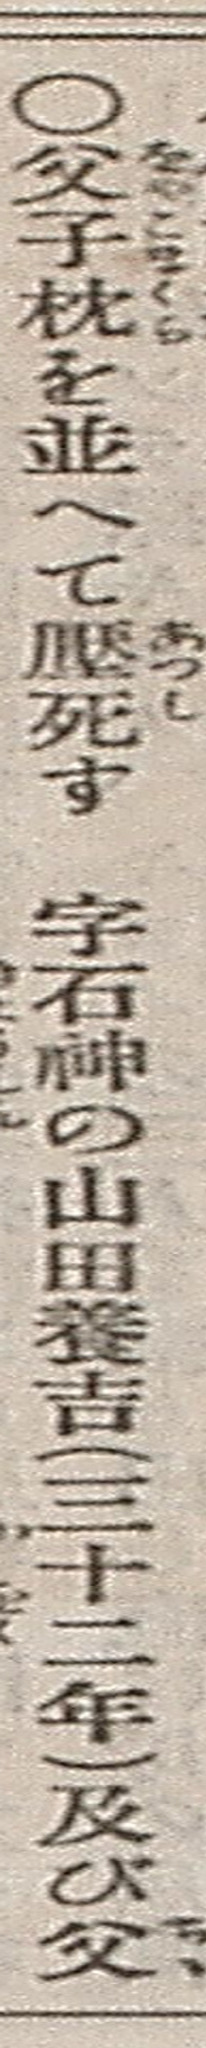〇父子枕を並へて圧死す字石神の山田養吉及び父
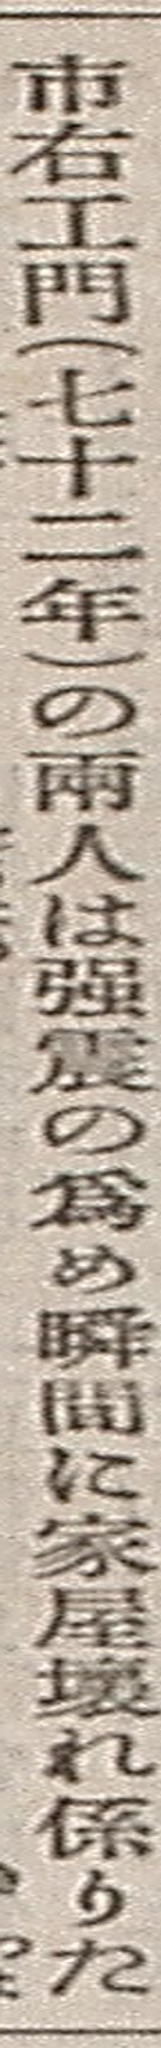市右エ門の両人は強震の為め瞬間に家屋壊れ係りた
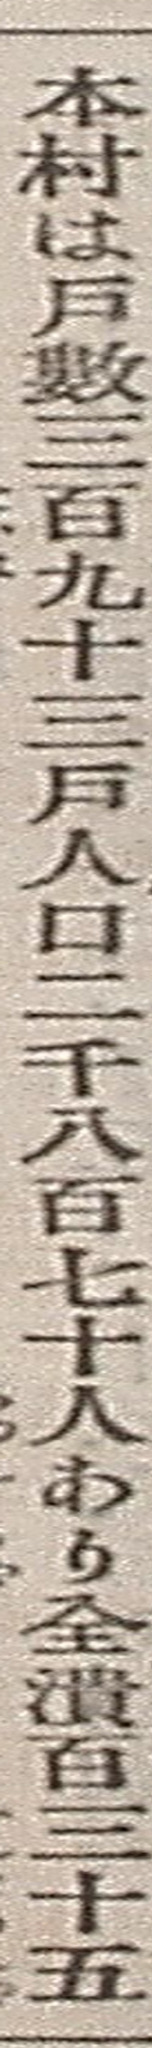本村は戸数三百九十三戸人口二千八百七十人あり全潰百三十五
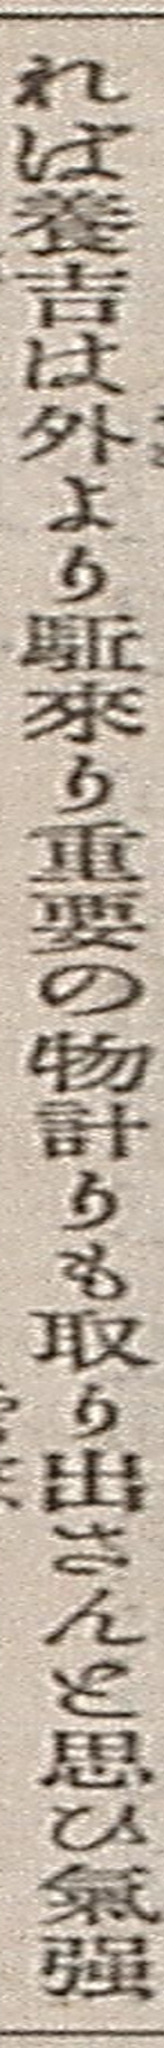れば養吉は外より駈来り重要の物計りも取り出さんと思ひ気強
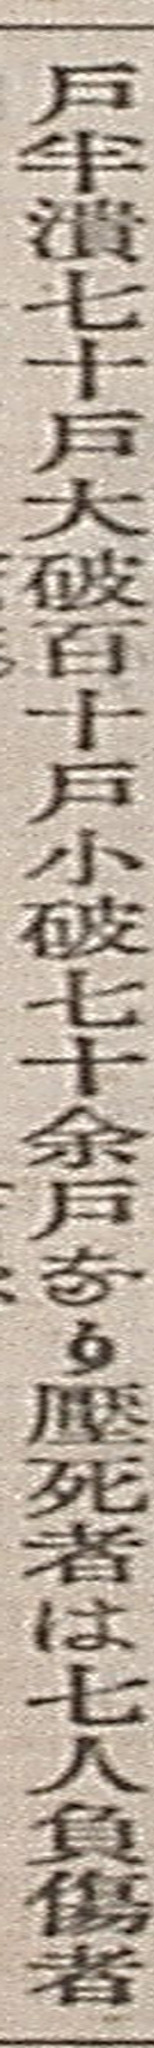戸半潰七十戸大破百十戸小破七十余戸なり圧死者は七人負傷者
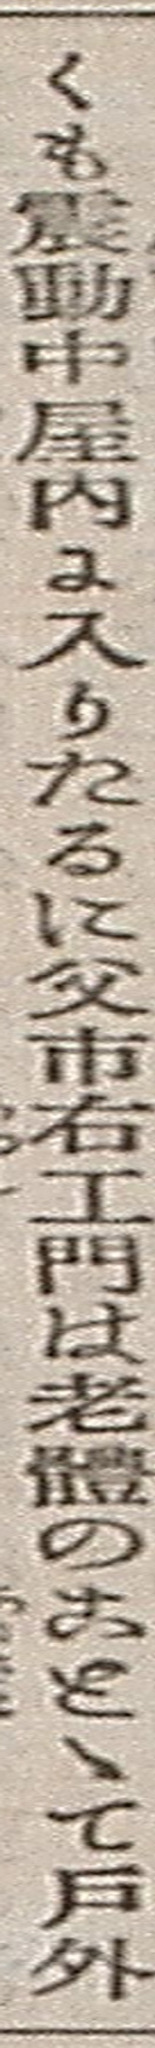くも震動中屋内に入りたるに父市右エ門が老体のことゝて戸外
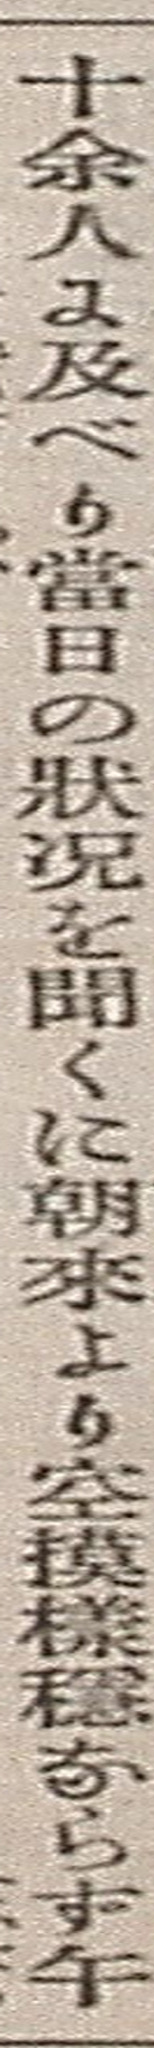十余人に及べり当日の状況を聞くに朝来より空模様穏ならず午
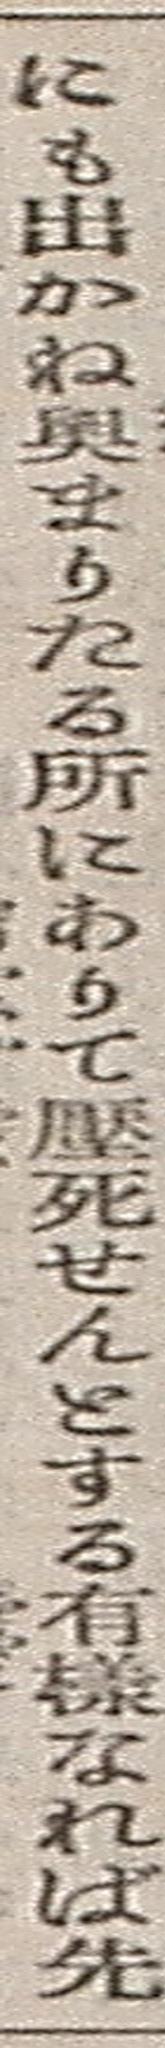にも出かね奥まりたる所にありて圧死せんとする有様なれば先
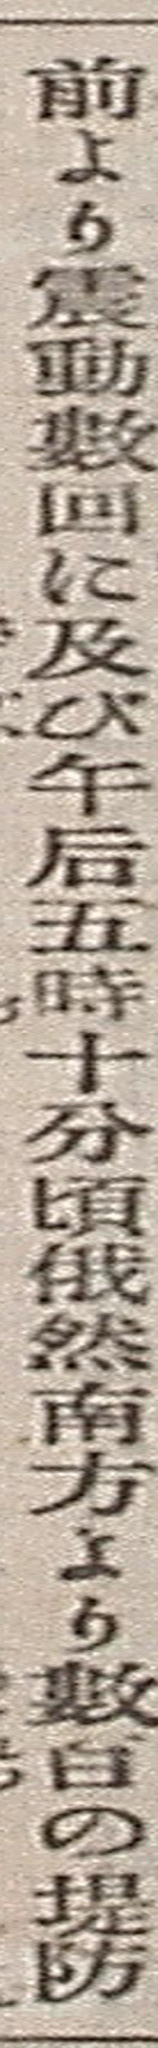前より震動数回に及び午后五時十分頃俄然南方より数百の堤防
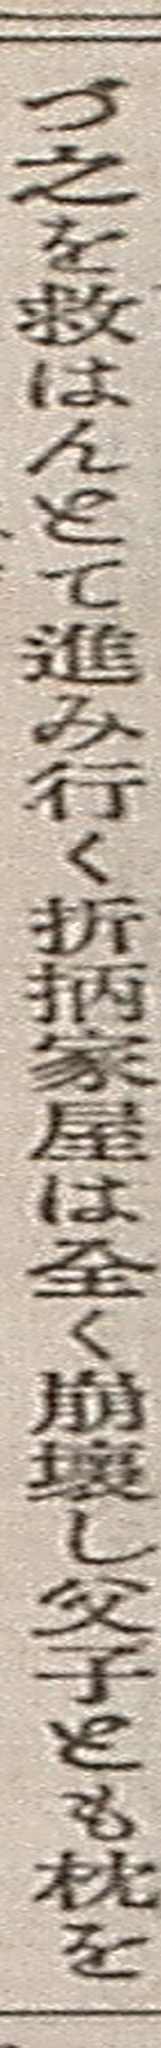づ之を救はんとて進み行く折柄家屋は全く崩壊し父子とも枕を
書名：風俗畫報臨時増刊第百二十四號　洪水地震被害録（上）
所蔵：東京大学地震研究所図書室 Earthquake Research Institute Library, The University of Tokyo, JAPAN
